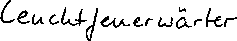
Leuchtfeuerwärter
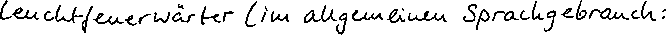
Leuchtfeuerwärter (im allgemeinen Sprachgebrauch:
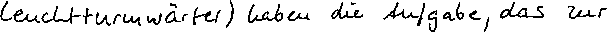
Leuchtturmwärter) haben die Aufgabe, das zur
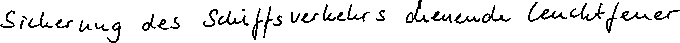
Sicherung des Schiffsverkehrs dienende Leuchtfeuer
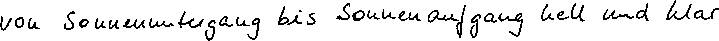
von Sonnenuntergang bis Sonnenaufgang hell und klar
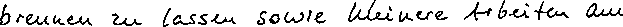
brennen zu lassen sowie kleinere Arbeiten am
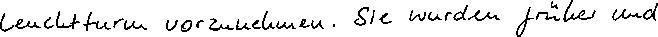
Leuchtturm vorzunehmen. Sie wurden früher und
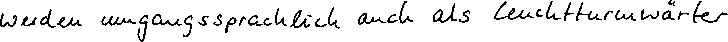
werden umgangssprachlich auch als Leuchtturmwärter
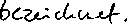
bezeichnet.
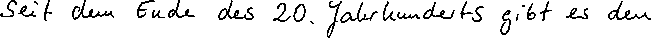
Seit dem Ende des 20. Jahrhunderts gibt es den
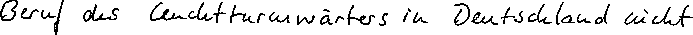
Beruf des Leuchtturmwärters in Deutschland nicht
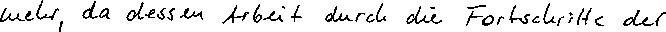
mehr, da dessen Arbeit durch die Fortschritte der
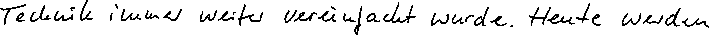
Technik immer weiter vereinfacht wurde. Heute werden
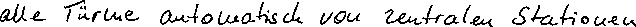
alle Türme automatisch von zentralen Stationen
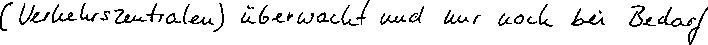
(Verkehrszentralen) überwacht und nur noch bei Bedarf
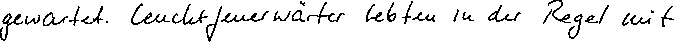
gewartet. Leuchtfeuerwärter lebten in der Regel mit
